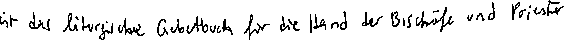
st das liturgische Gebetbuch für die Hand der Bischöfe und Priester
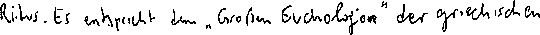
Ritus. Es entspricht dem "Großen Euchologion" der griechischen
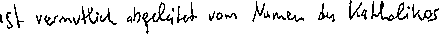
ist vermutlich abgeleitet vom Namen des Katholikos
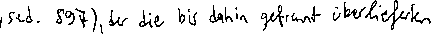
sed. 897), der die bis dahin getrennt überlieferten
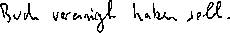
Buch vereinigt haben soll.
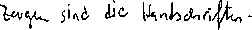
Zeugen sind die Handschriften
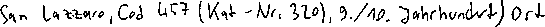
San Lazzaro, Cod. 457 (Kat.-Nr. 320), 9./10. Jahrhundert, Ort
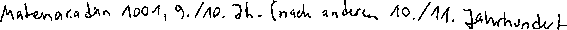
Matenaradan 1001, 9./10. Jh. (nach anderen 10./11. Jahrhundert
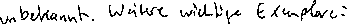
unbekannt.Weitere wichtige Exemplare:
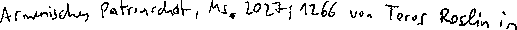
Armenisches Patriarchat, Ms. 2027; 1266 von Toros Roslin in
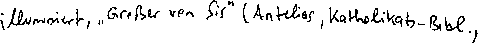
Illuminiert, "Großer von Sis" (Antelias, Katholikats-Bibl.,
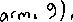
arm. 9),
